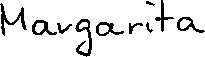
Margarita
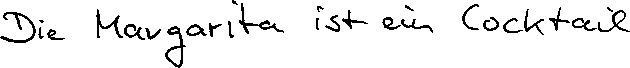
Die Margarita ist ein Cocktail
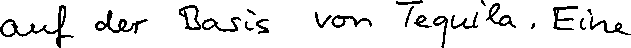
auf der Basis von Tequila. Eine
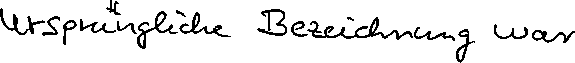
ursprüngliche Bezeichnung war
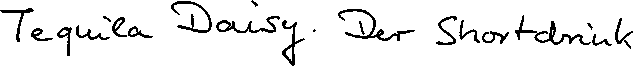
Tequila Daisy. Der Shortdrink
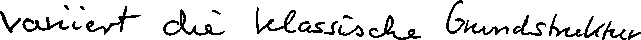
variiert die klassische Grundstruktur
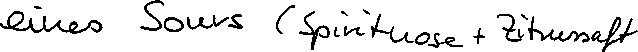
eines Sours (Spirituose + Zitrussaft
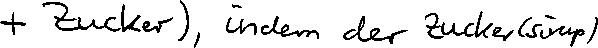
+ Zucker), indem der Zucker(sirup)
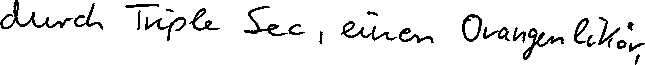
durch Triple Sec, einen Orangenlikör,
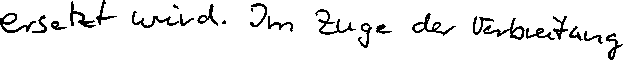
ersetzt wird. Im Zuge der Verbreitung
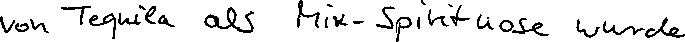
von Tequila als Mix-Spirituose wurde
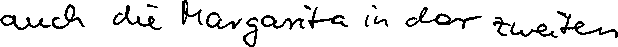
auch die Margarita in der zweiten
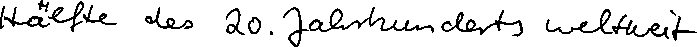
Hälfte des 20. Jahrhunderts weltweit
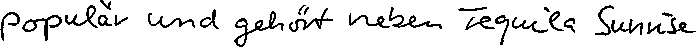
populär und gehört neben Tequila Sunrise
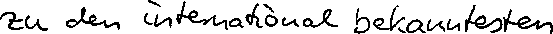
zu den international bekanntesten
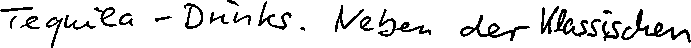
Tequila-Drinks. Neben der klassischen
